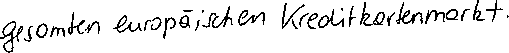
gesamten europäischen Kreditkartenmarkt.
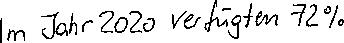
Im Jahr 2020 verfügten 72 %
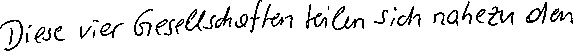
Diese vier Gesellschaften teilen sich nahezu den
